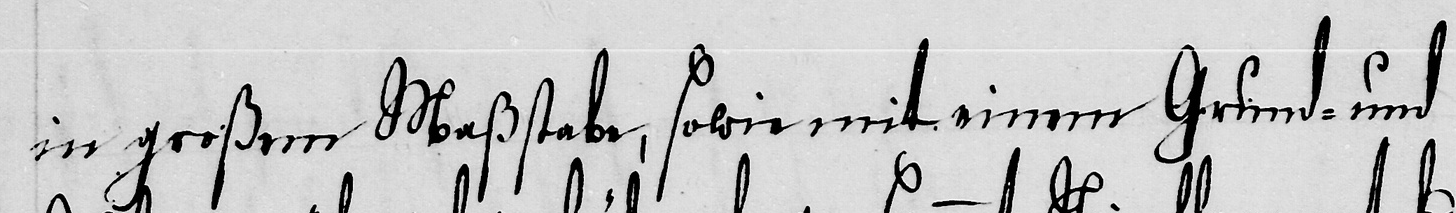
in großem Maßstabe, sowie mit einem Grund- und
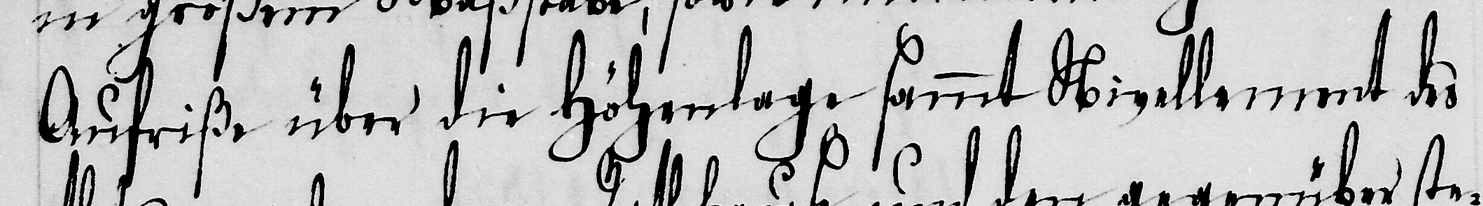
Aufriße über die Höhenlage sammt Nivellement des
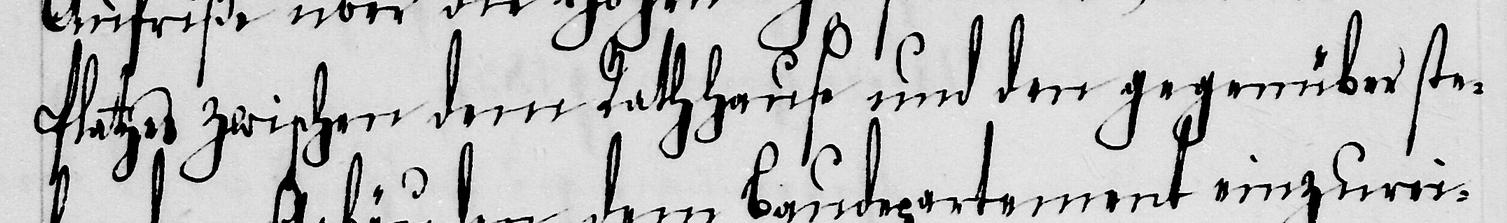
Platzes zwischen dem Rathhause und den gegenüberste¬
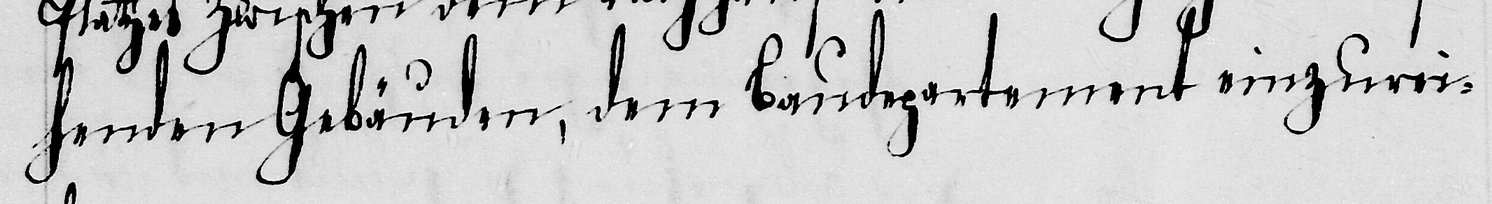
henden Gebäuden, dem Baudepartement einzurei¬
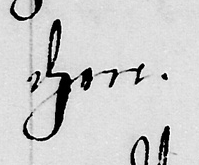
chen.
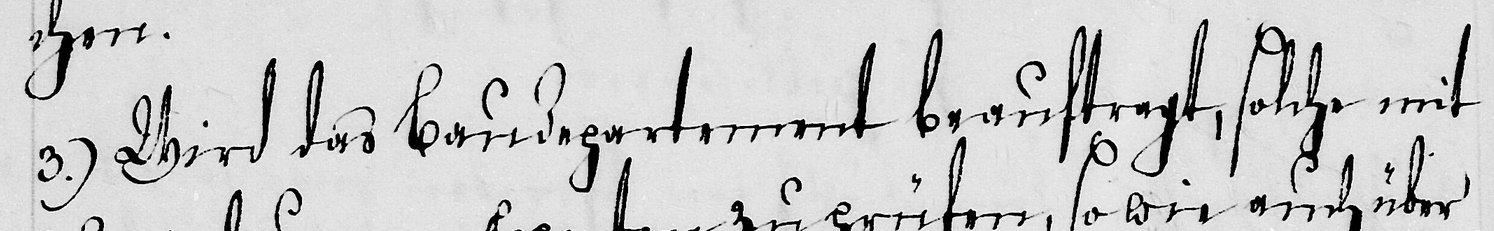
3.) Wird das Baudepartement beauftragt, solche mit
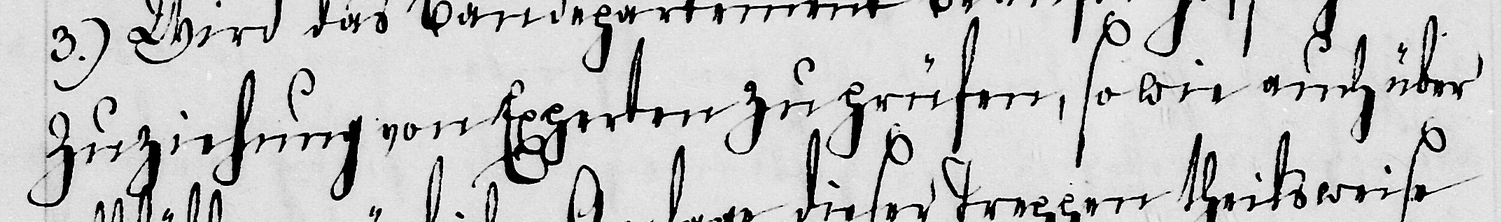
Zuziehung von Experten zu prüfen, sowie auch über
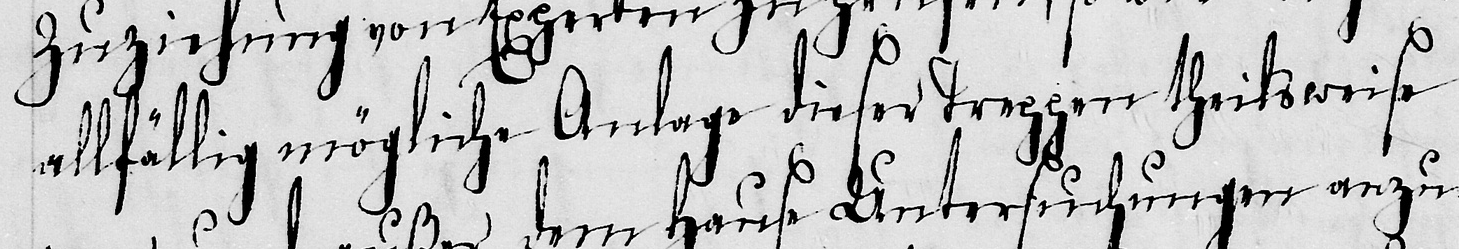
allfällig mögliche Anlage dieser Treppen theilsweise
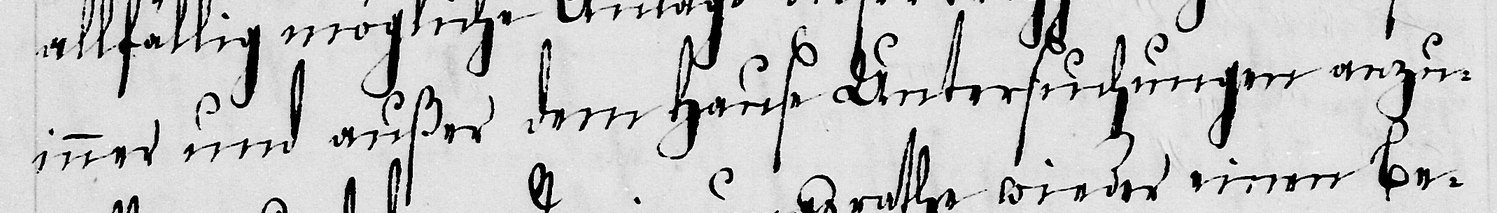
inner und außer dem Hause Untersuchungen anzu¬
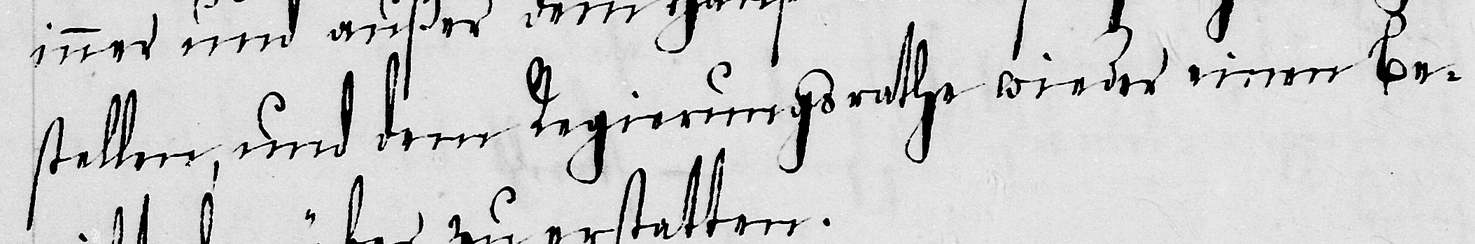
stellen, und dem Regierungsrathe wieder einen Be¬
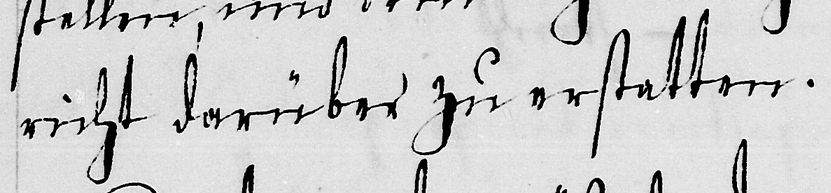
richt darüber zu erstatten.
